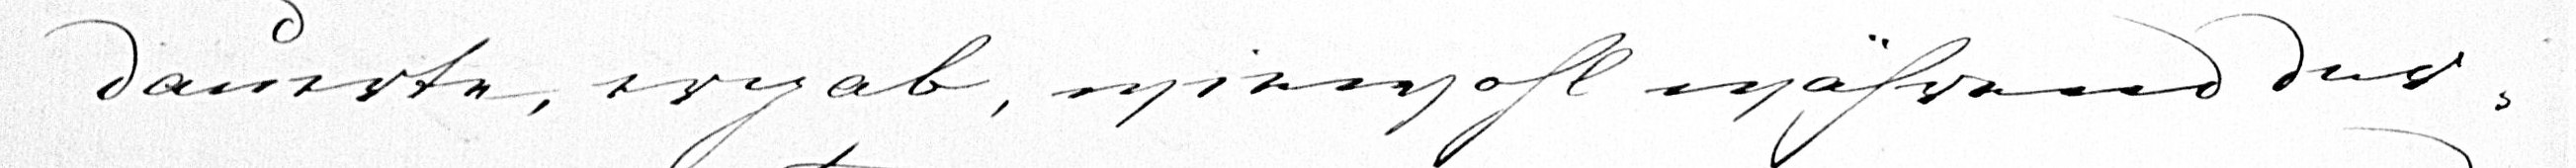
dauerte, ergab, wiewohl während der¬
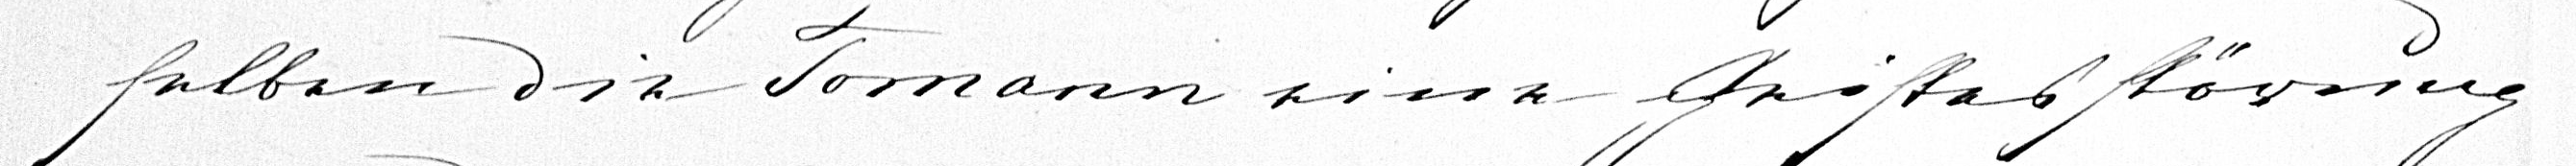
selben die Tomann eine Geistesstörung
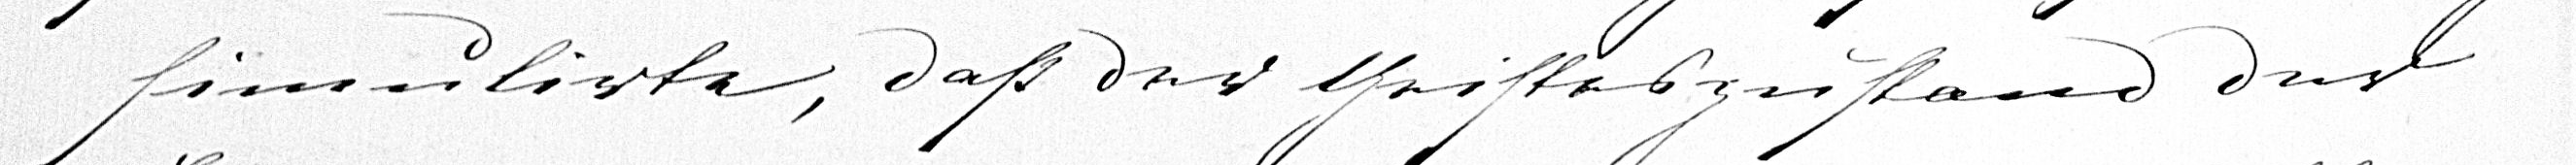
simulirte, daß der Geisteszustand der
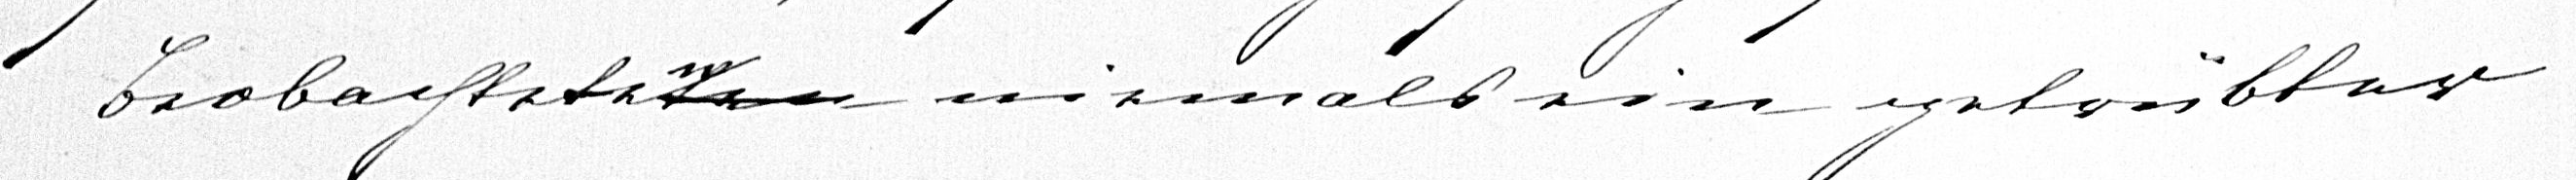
Beobachteten niemals ein getrübter
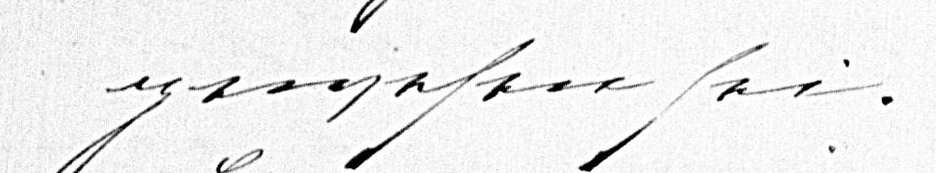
gewesen sei.
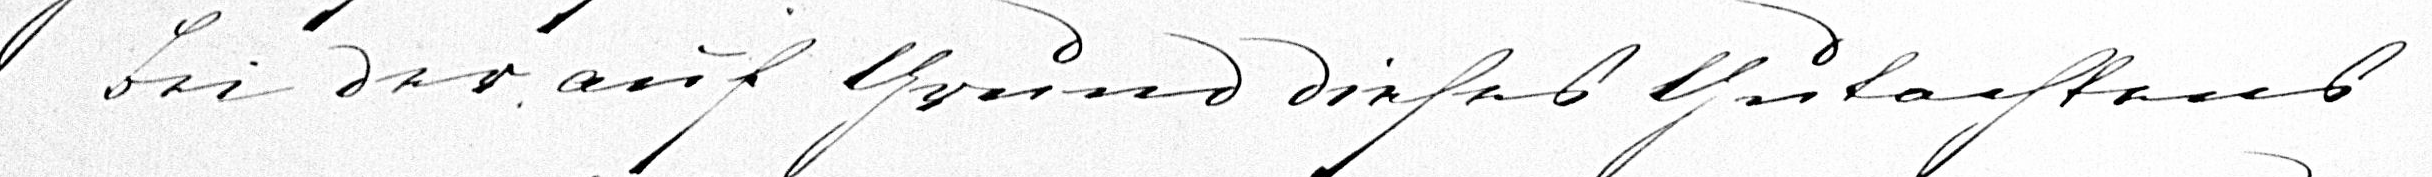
Bei der auf Grund dieses Gutachtens
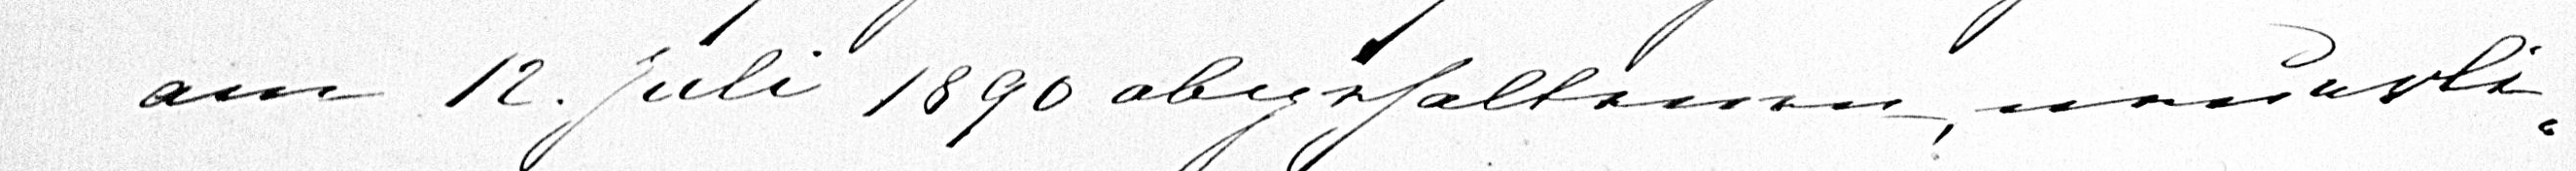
am 12. Juli 1890 abgehaltenen, neuerli¬
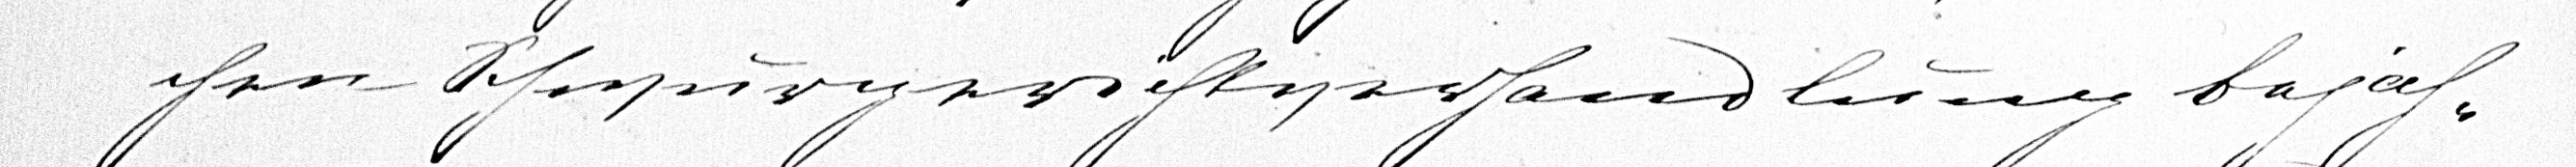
chen Schwurgerichtverhandlung bejah¬
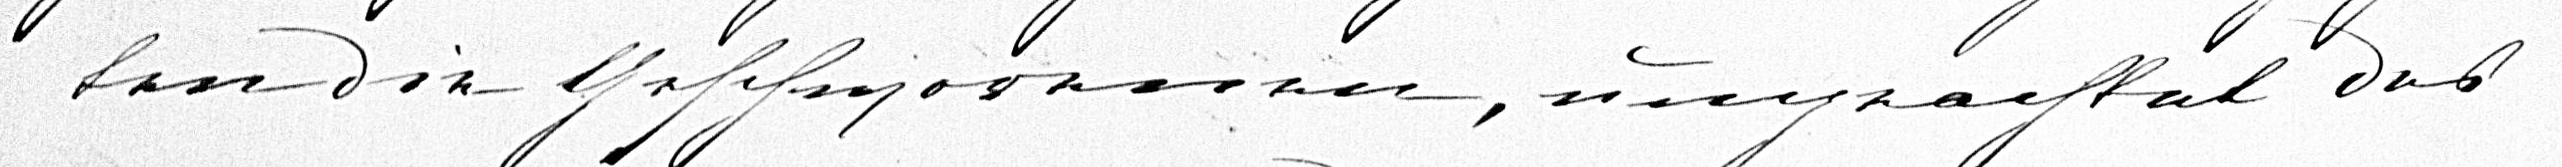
ten die Geschworenen, ungeachtet des
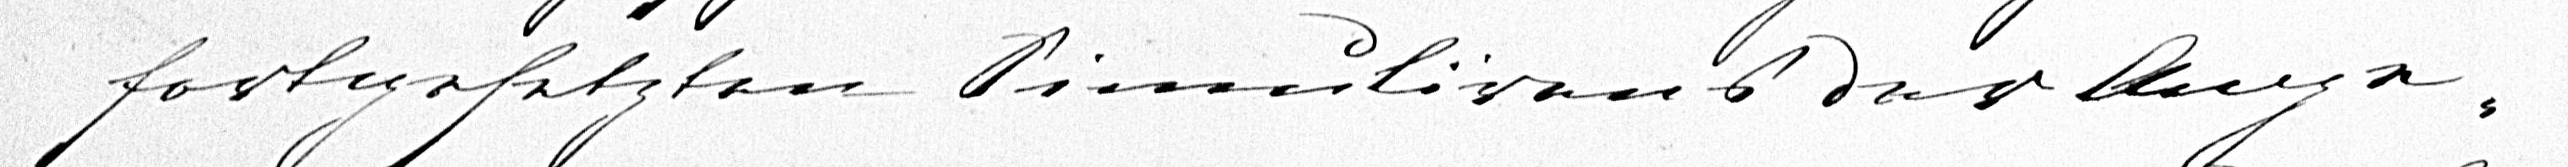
fortgesetzten Simulirens der Ange¬
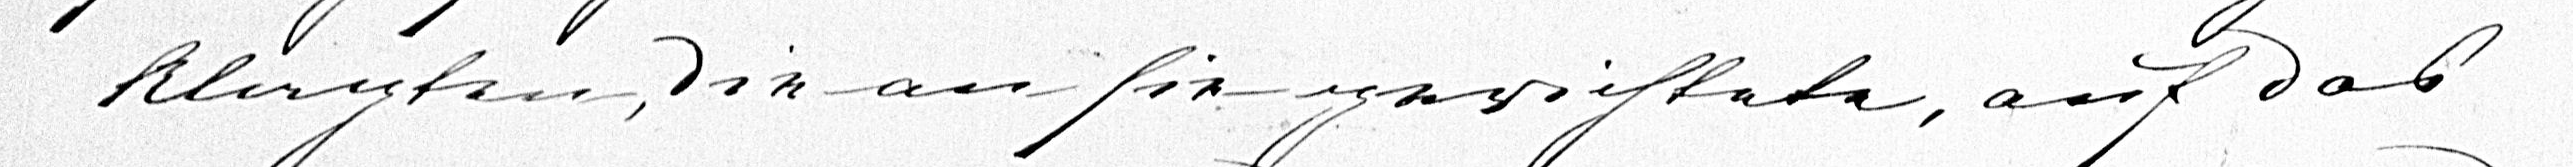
klagten, die an sie gerichtete, auf das
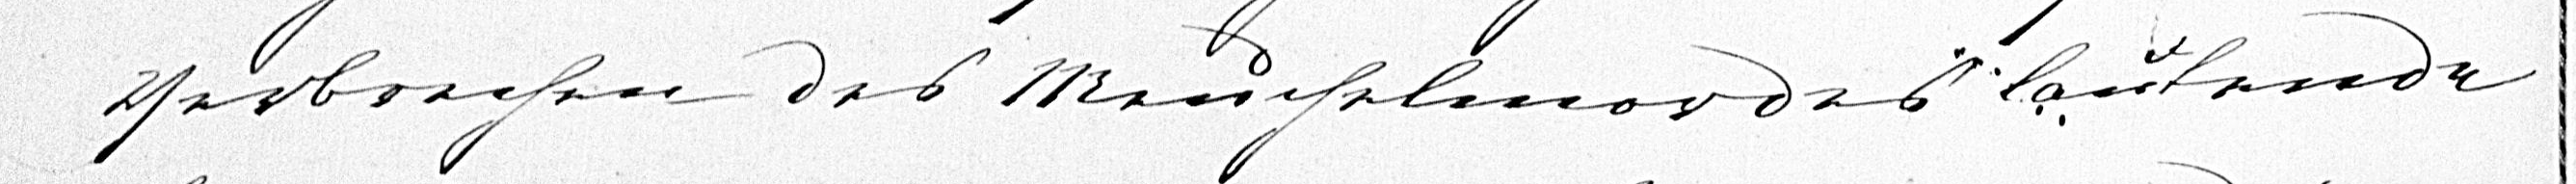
Verbrechen des Meuchelmordes lautende
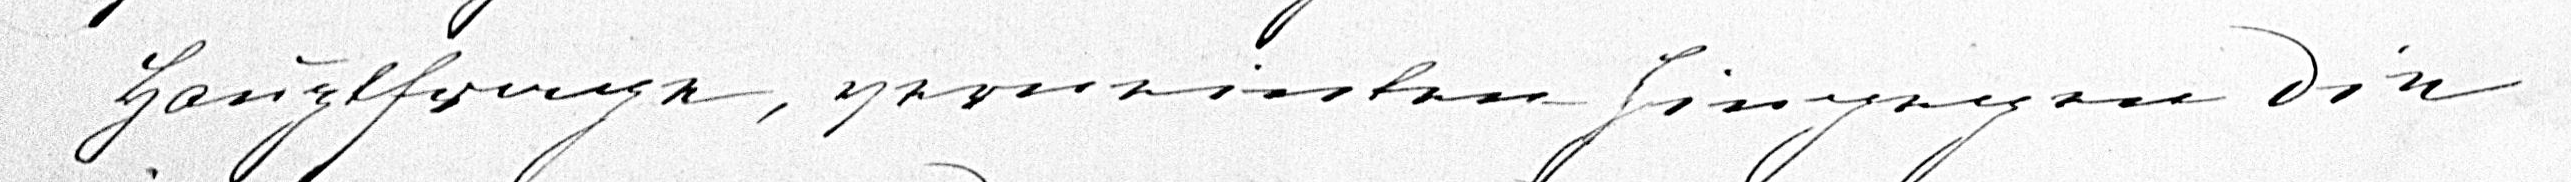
Hauptfrage, verneinten hingegen die
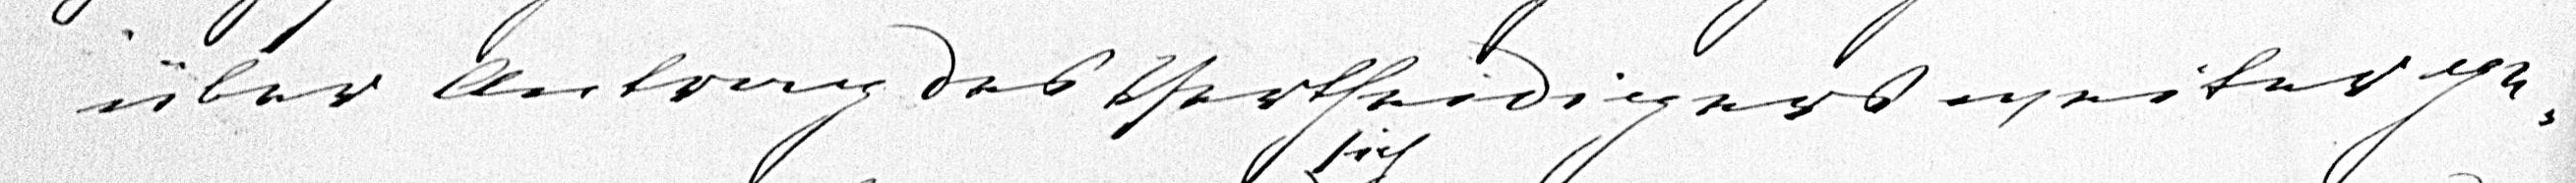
über Antrag des Vertheidigers weiter ge¬
